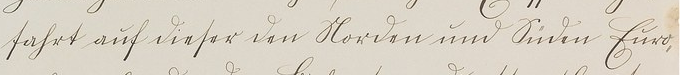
fahrt auf dieser den Norden und Süden Euro-
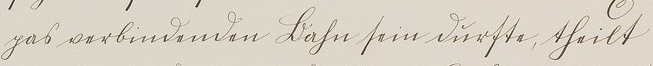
pas verbindenden Bahn sein durfte, theilt
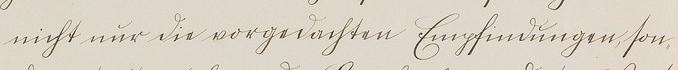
nicht nur die vorgedachten Empfindungen, son-
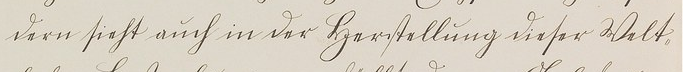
dern sieht auch in der Herstellung dieser Welt-
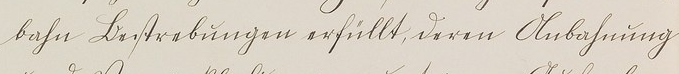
bahn Bestrebungen erfüllt, deren Anbahnung
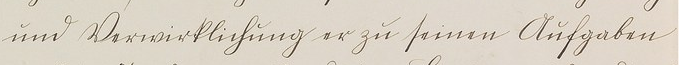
und Verwirklichung er zu seinen Aufgaben
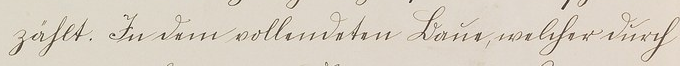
zählt. In dem vollendeten Baue, welcher durch
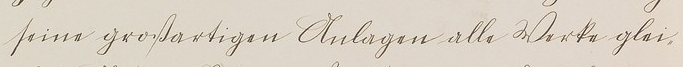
seine großartigen Anlagen alle Werke glei-
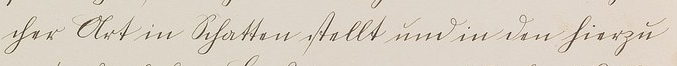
cher Art in Schatten stellt und in den hierzu
